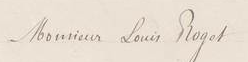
Monsieur Louis Roget
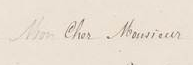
Cher Monsieur
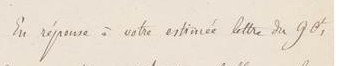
En réponse à votre estimée lettre du 9 Ct,
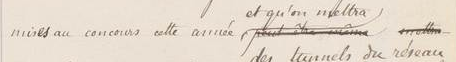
mises au concours cette année peut-être mêmemettra
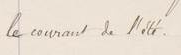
dans le courant de l'été.
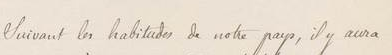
Suivant les habitudes de notre pays, il y aura
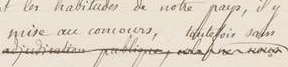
ne nousmise au concours,
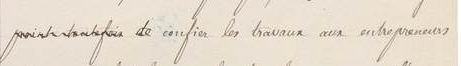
point toutefois de confier les travaux aux entrepreneurs
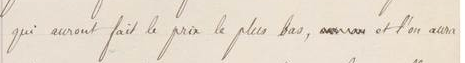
qui auront fait le prix le plus bas, ... et l'on aura
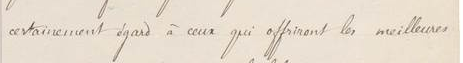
certainement égard à ceux qui offriront les meilleures
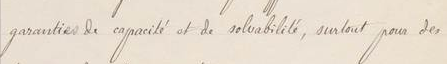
garanties de capacité et de solvabilité, surtout pour des
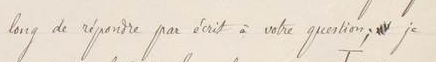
long de répondre par écrit à votre question; et je
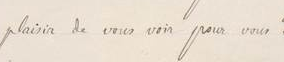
plaisir de vous voir pour vous
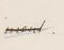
en entretenue
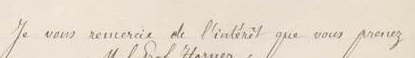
Je vous remercie de l'intérêt que vous prenez
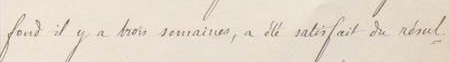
fond il y a trois semaines, a été satisfait du résul-
